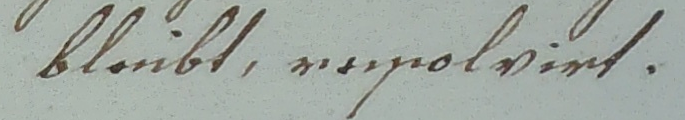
bleibt repolrirt.
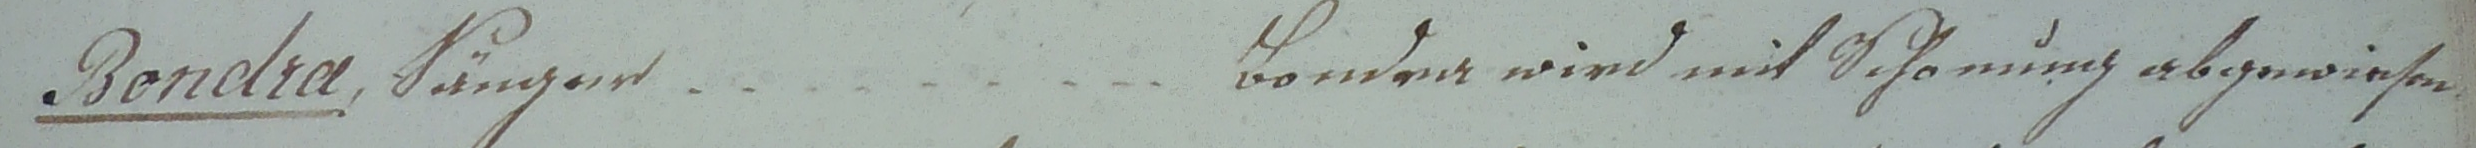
Bondra, Sänger ……… Bondra wird mit Schonung abgewiesen
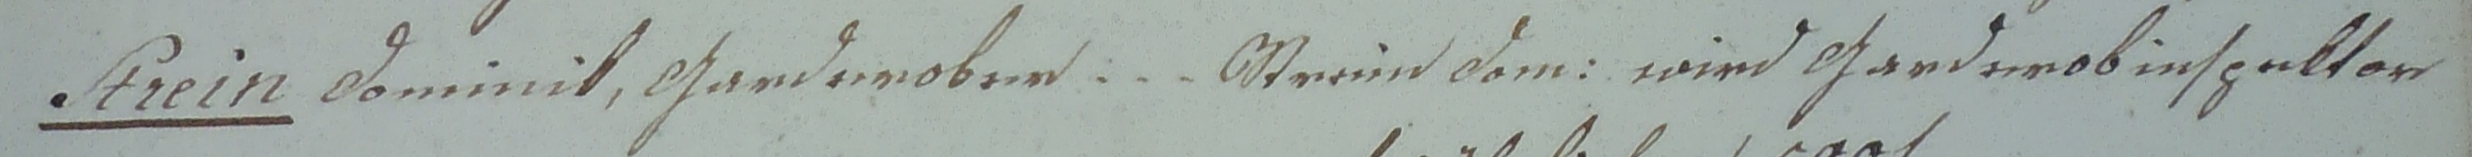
Strein Dominik, Garderober … Strein Dom: wird Garderobinspektor
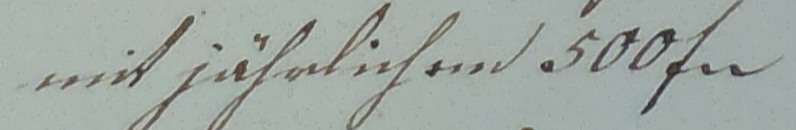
mit jährlichen 500fn
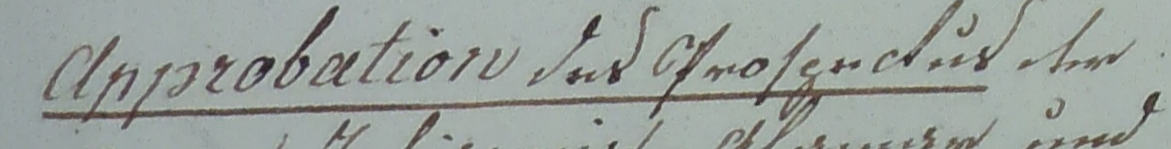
Approbation des Prospectus der
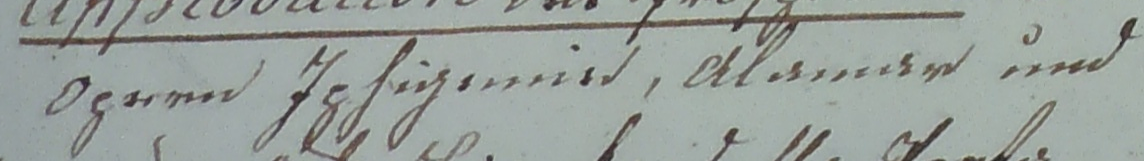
Opern Iphigenie, Alamar und
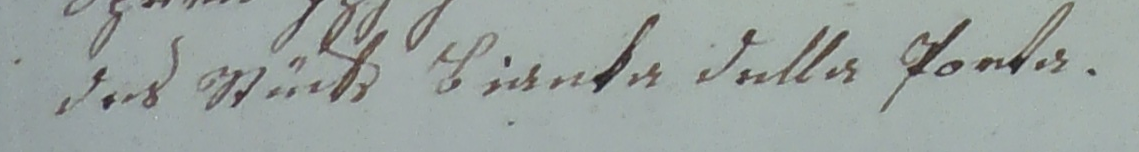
des Stücks Bianka della Porta.
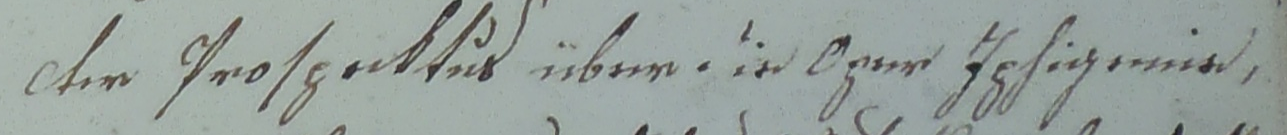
Der Prospektus über die Oper Iphigenie,
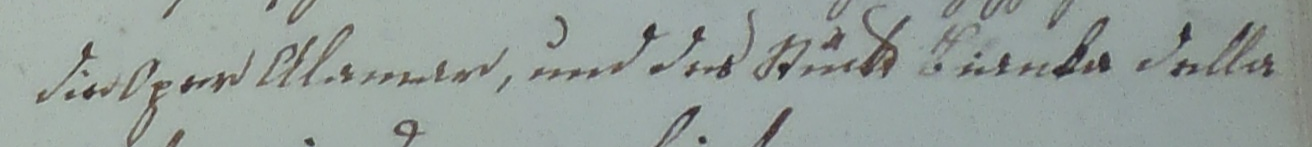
die Oper Alamar, und des Stücks Bianka della
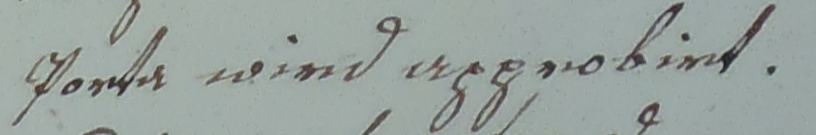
Porta wird approbirt.
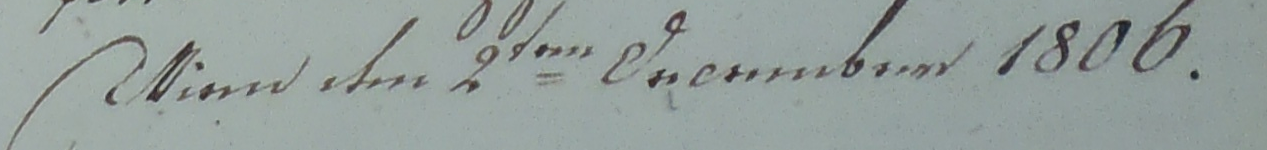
Wien den 2te͇n December 1806.
